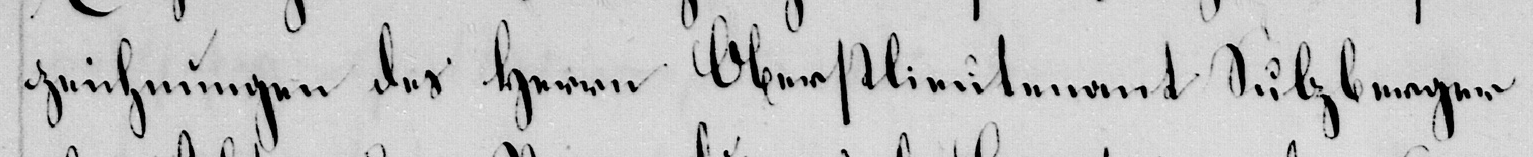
zeichnungen des Herrn Oberstlieutenant Sulzberger
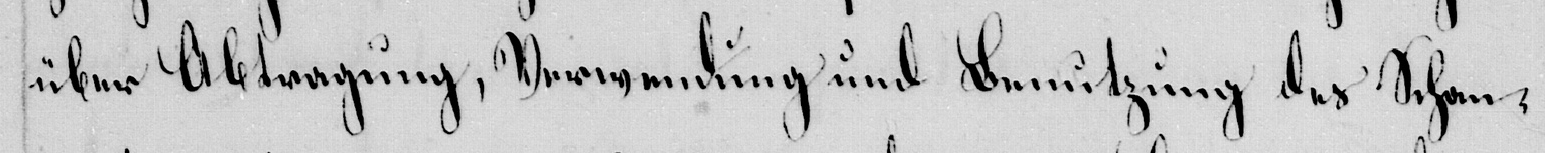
über Abtragung, Verwendung und Benutzung des Schan¬
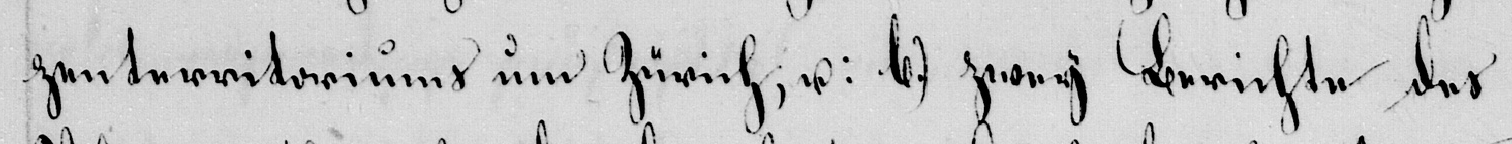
zenterritoriums um Zürich, u: b.) zwey Berichte des
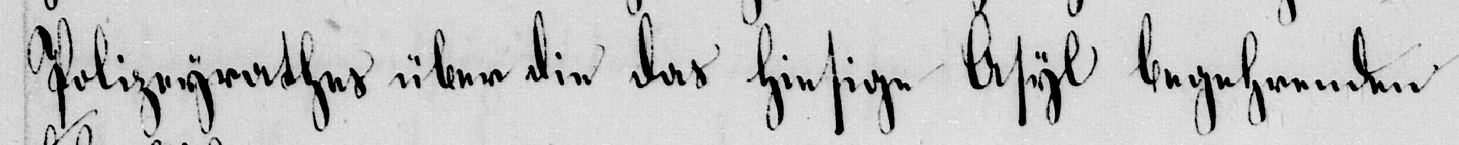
Polizeyrathes über die das hiesige Asyl begehrenden
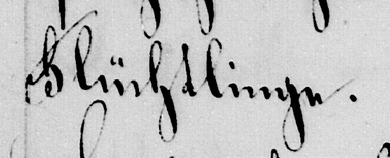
Flüchtlinge.
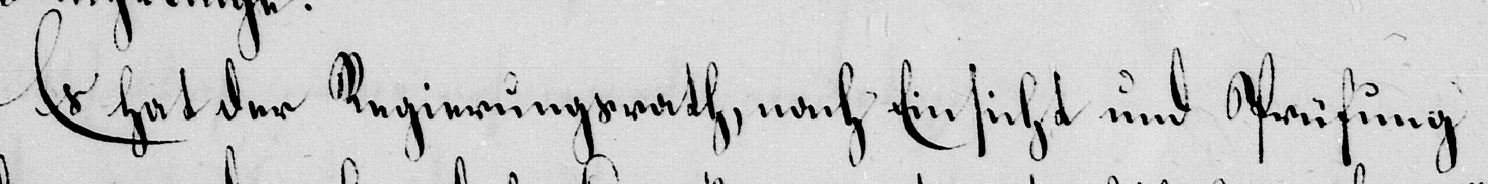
Es hat der Regierungsrath, nach Einsicht und Prüfung
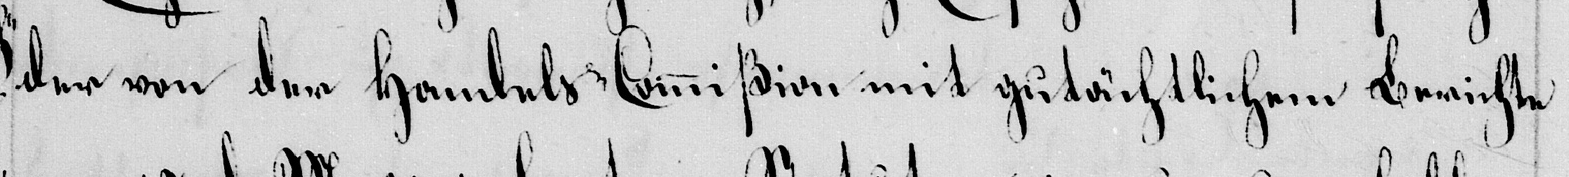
der von der Handels-Commißion mit gutächtlichem Berichte
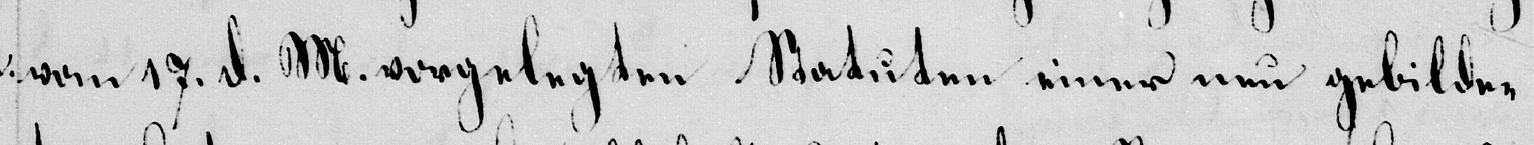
vom 17. d. M. vorgelegten Statuten einer neu gebilde¬
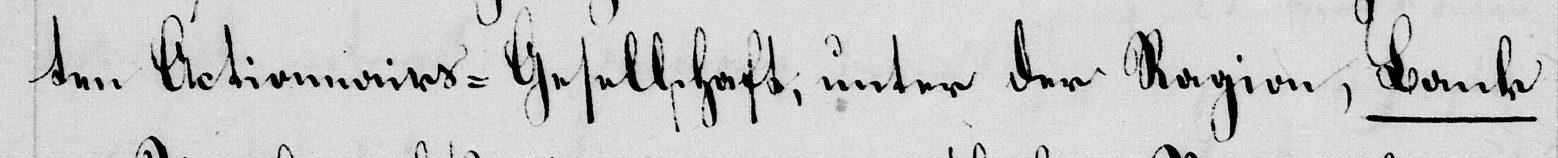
ten Actionnairs-Gesellschaft, unter der Ragion, Bank
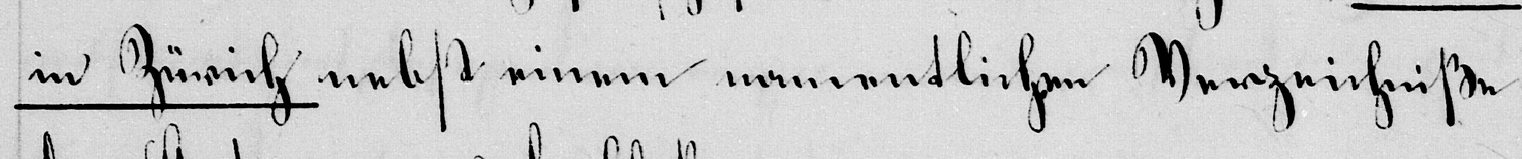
in Zürich nebst einem namentlichen Verzeichniße
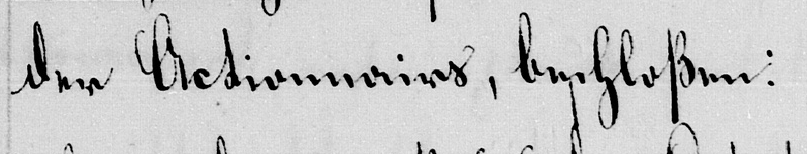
der Actionnairs, beschloßen:
